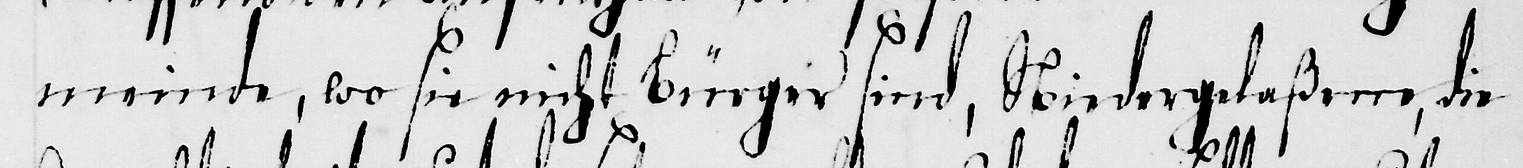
meinde, wo sie nicht Bürger sind, Niedergelaßene, die
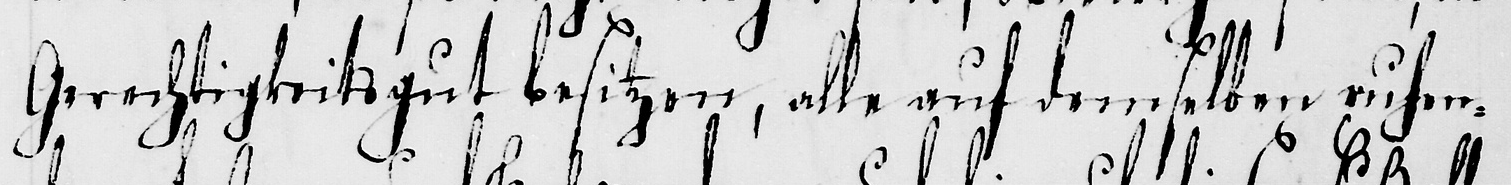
Gerechtigkeitsgut besitzen, alle auf demselben ruhen¬
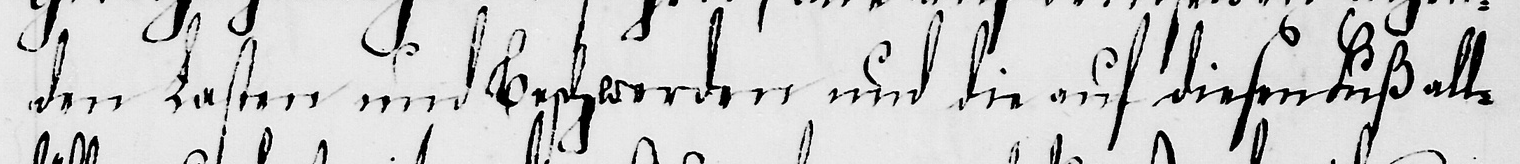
den Lasten und Beschwerden und die auf diesen Fuß all¬
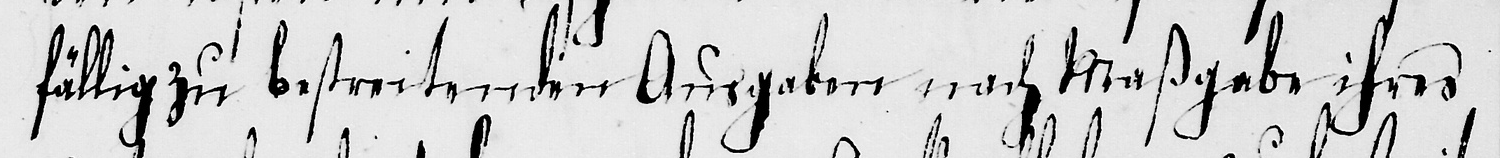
fällig zu bestreitenden Ausgaben nach Maßgabe ihres
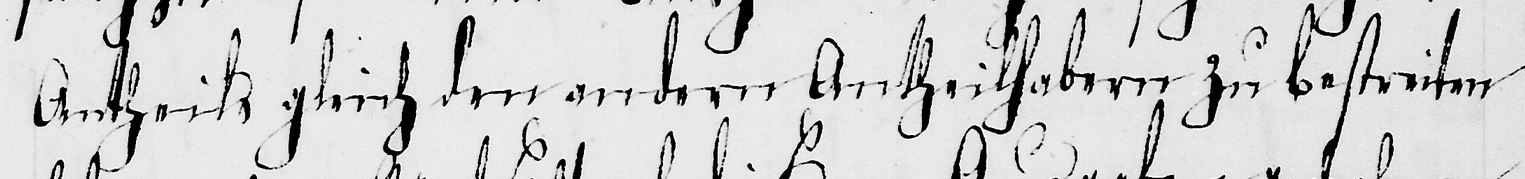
Antheils gleich den andern Antheilhabern zu bestreiten
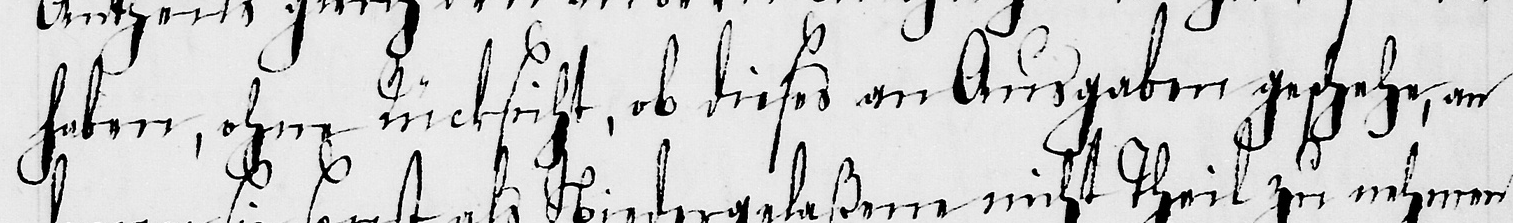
haben, ohne Rücksicht, ob dieses an Ausgaben geschehe, an
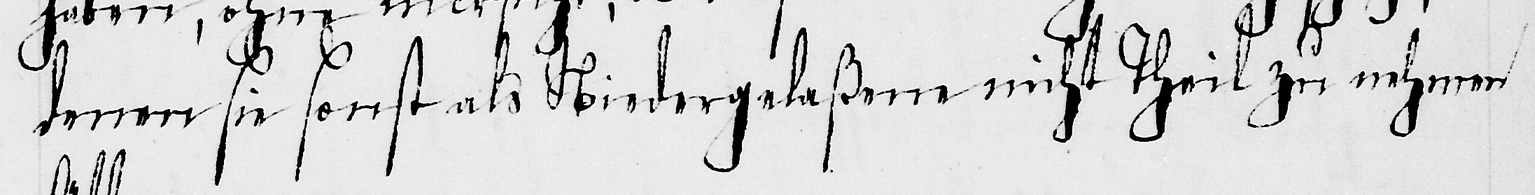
denen sie sonst als Niedergelaßene nicht Theil zu nehmen
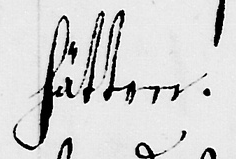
hätten.
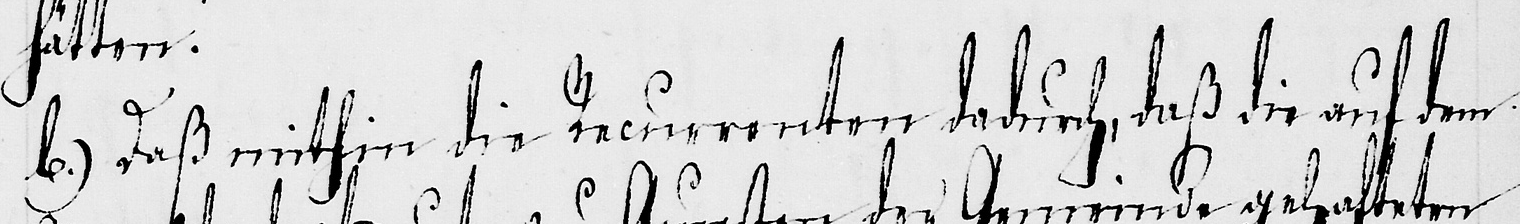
b.) Daß mithin die Recurrenten dadurch, daß die auf dem
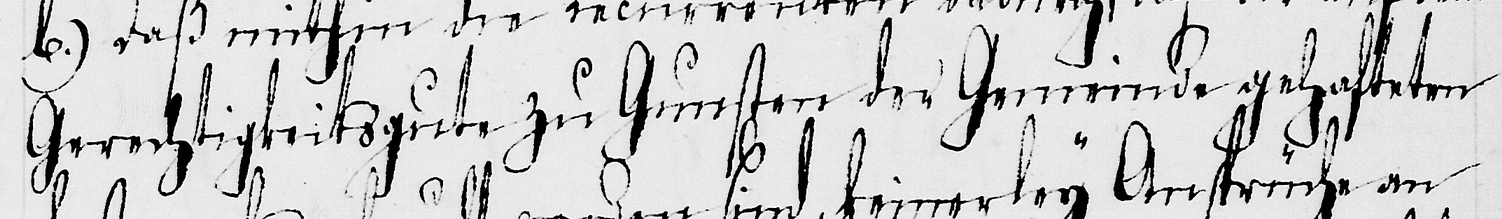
Gerechtigkeitsgute zu Gunsten der Gemeinde gehafteten
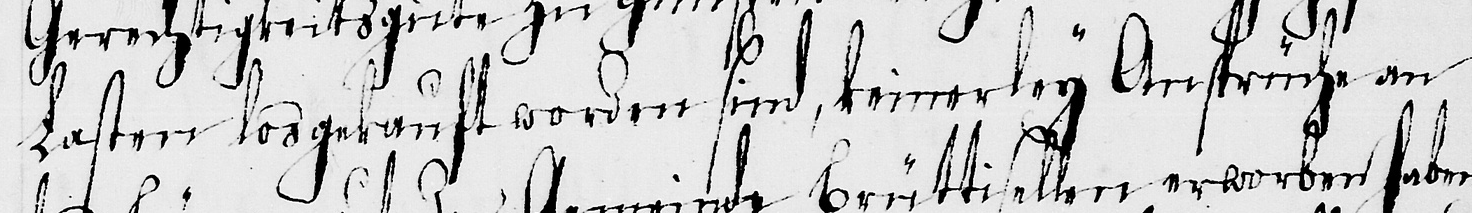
Lasten losgekauft worden sind, keinerley Ansprüche an
